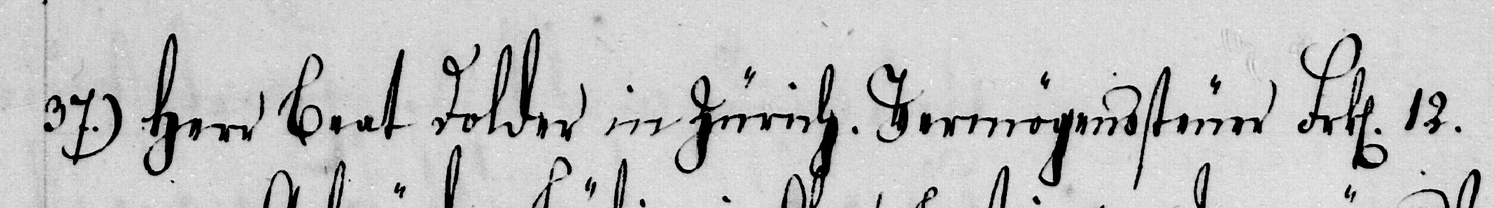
37.) Herr Beat Dolder in Zürich. Vermögenssteuer Frk[en].
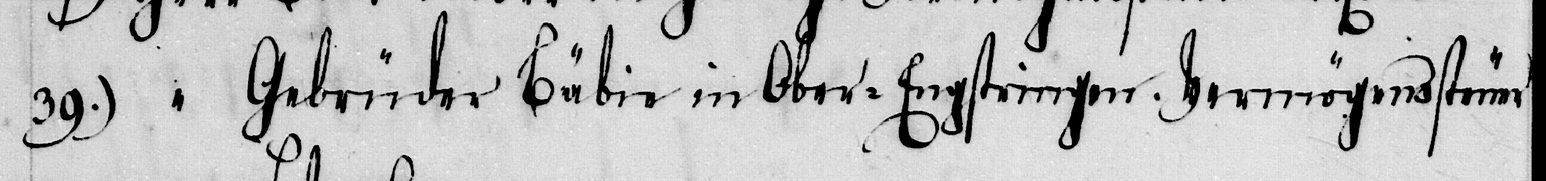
39.) " Gebrüder Bäbie in Ober-Engstringen. Vermögenssteuer
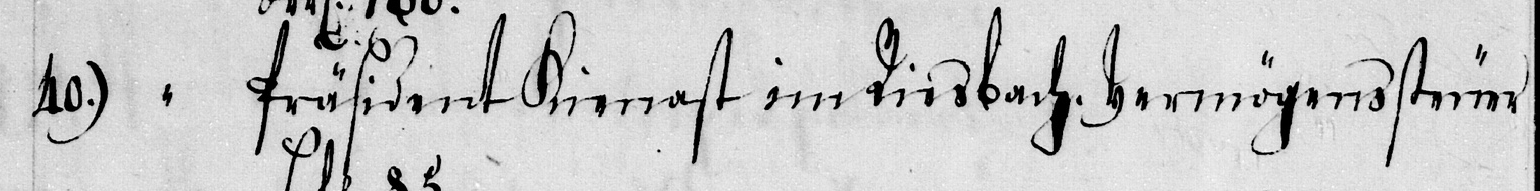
40.) " Präsident Kienast im Riesbach. Vermögenssteuer
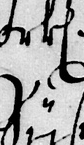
85.
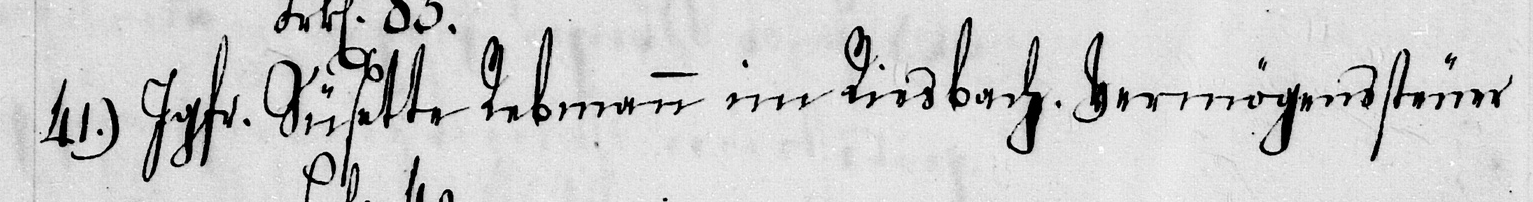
41.) Jgfr. Süsette Rebmann im Riesbach. Vermögenssteuer
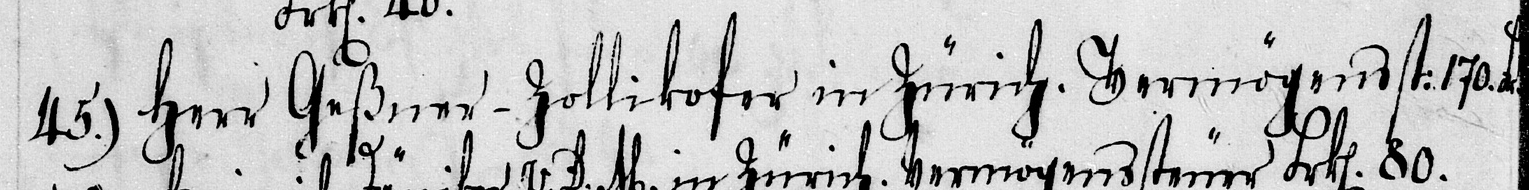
45.) Herr Geßner-Zollikofer in Zürich. Vermögensst: 170.
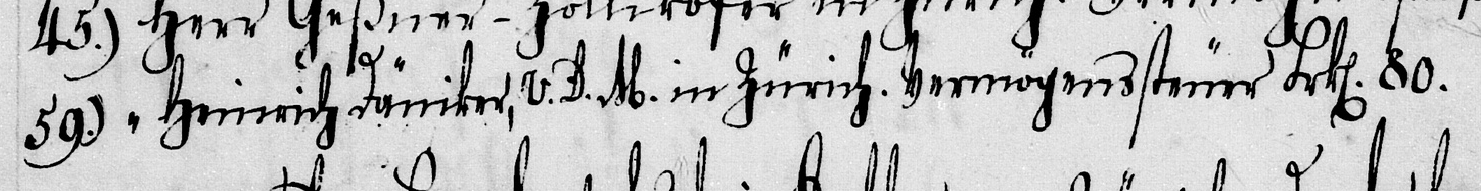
59.) " Heinrich Däniker, V. D. M in Zürich. Vermögenssteuer Frk[en].
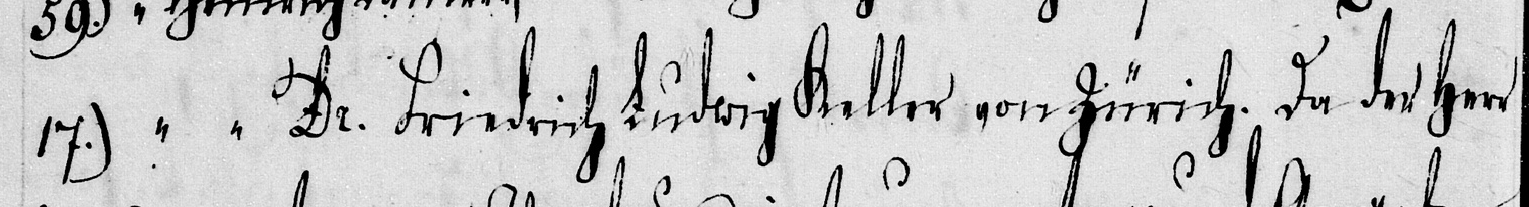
17.) " " Dr. Friedrich Ludwig Keller von Zürich. Da der
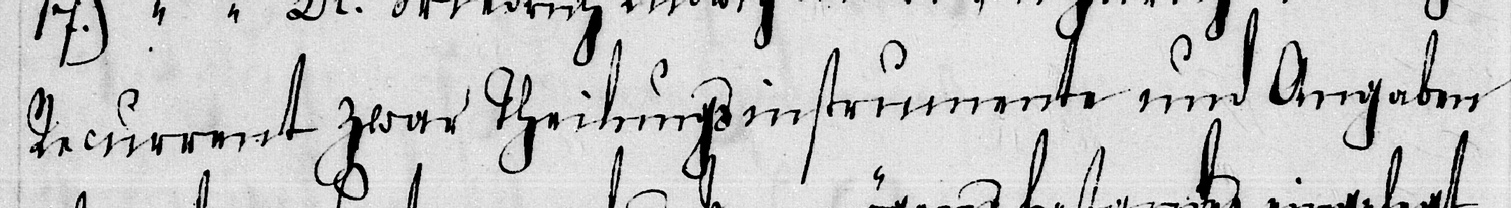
Recurrent zwar Theilungsinstrumente und Angaben
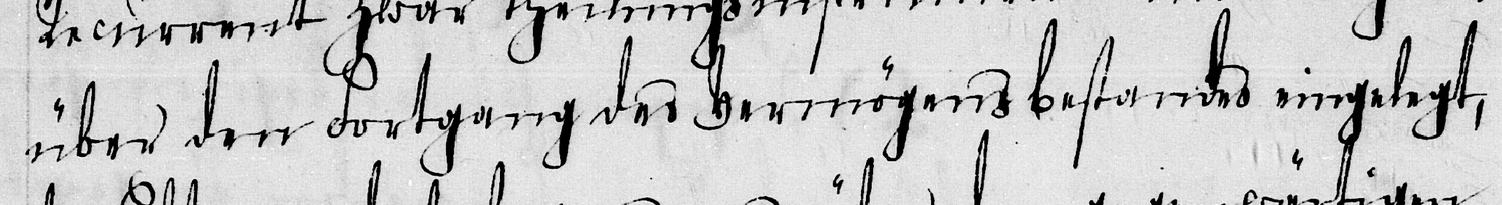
über den Fortgang des Vermögensbestandes eingelegt,
